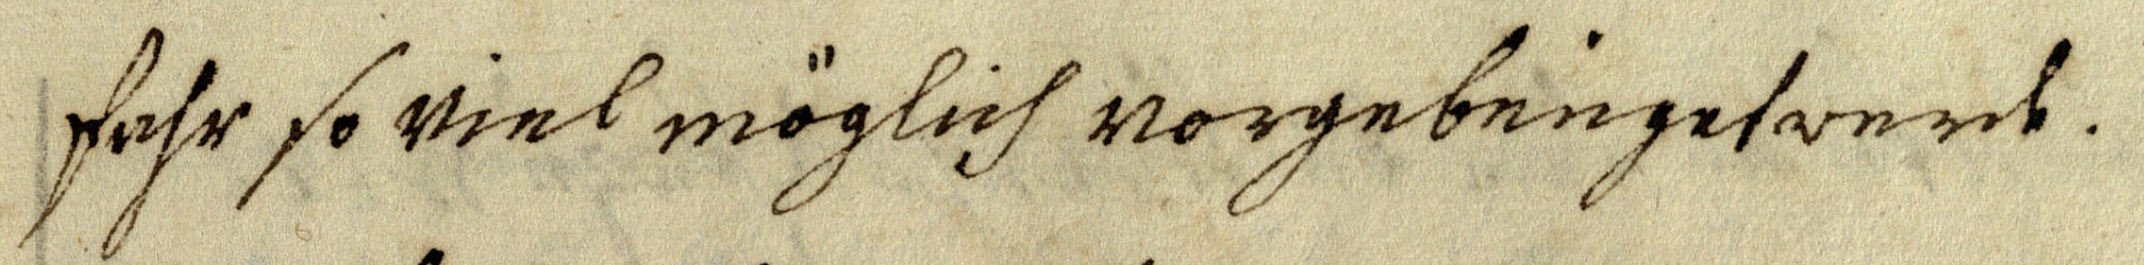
fahr so viel möglich vorgebeuget werde.
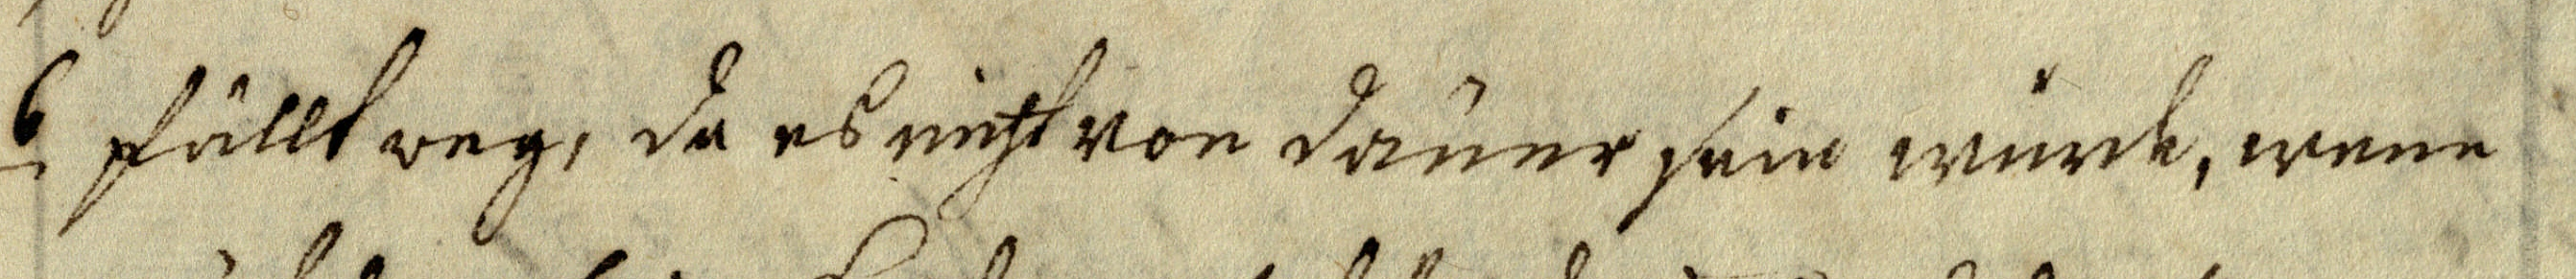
ad 6 fällt weg, da es nicht von Dauer sein würde, wenn
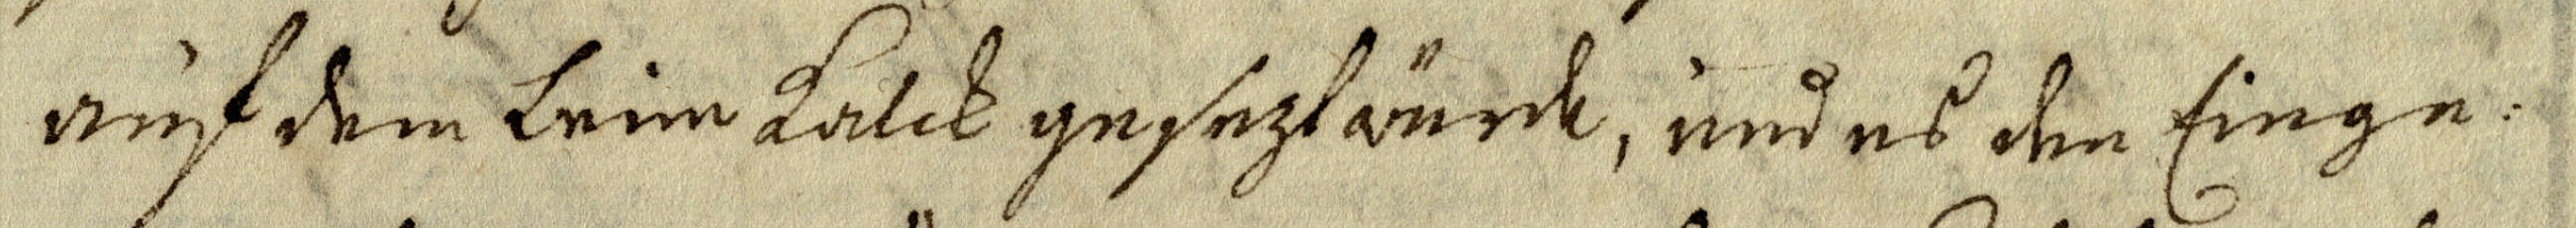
auf dem Leim Kalck gesezt würde, und es den Einge¬
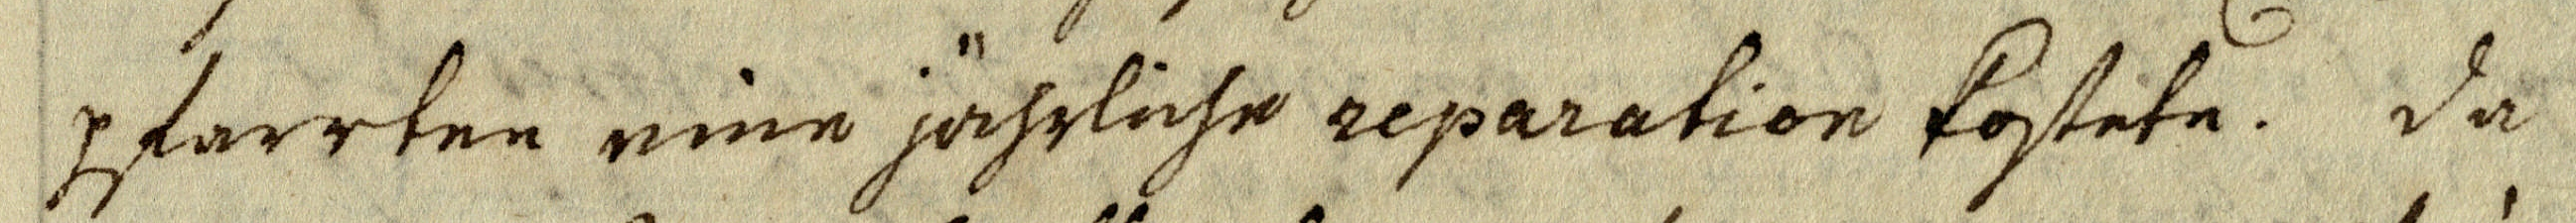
pfarrten eine jährliche reparation kostete. Da
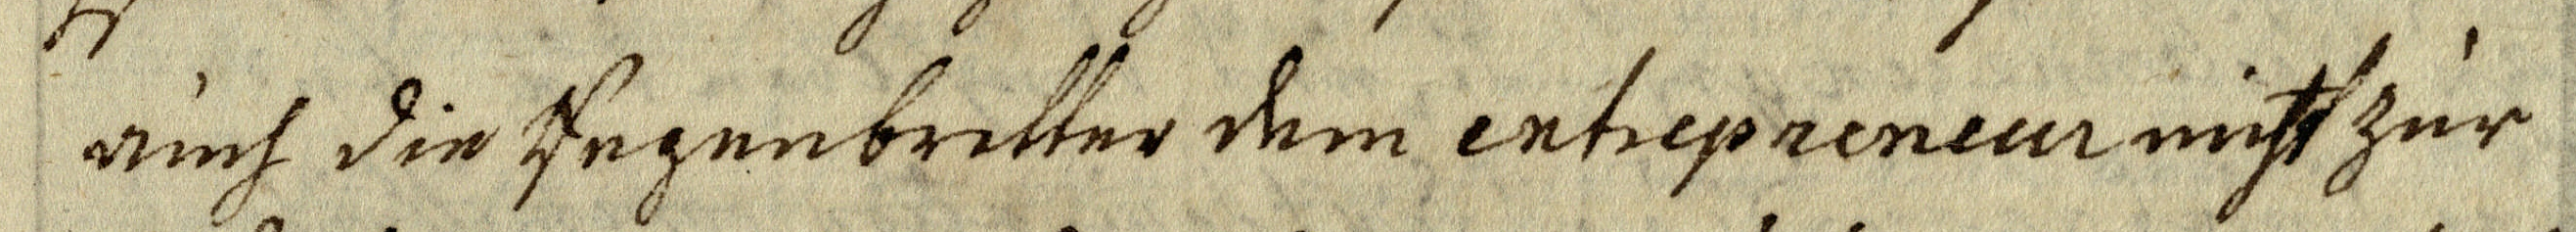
auch die Regenbretter dem entrepreneur nicht zur
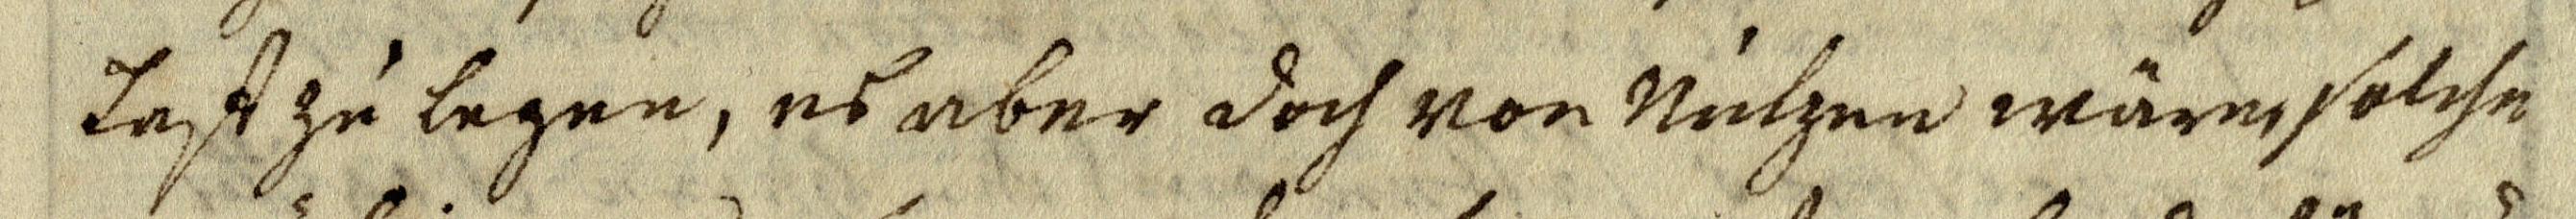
Last zu legen, es aber doch von Nutzen wäre, solche
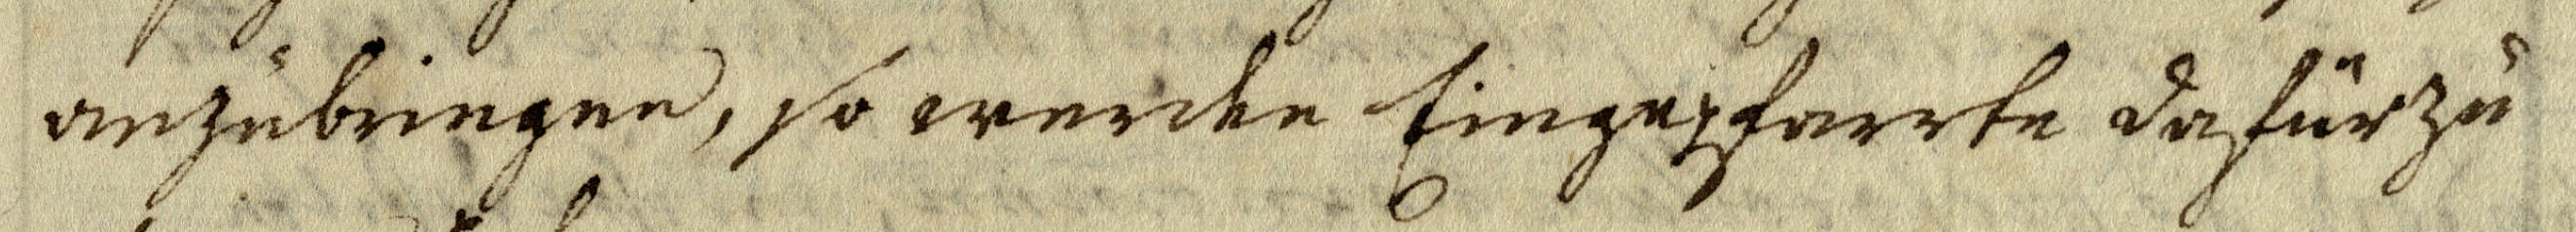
anzubringen, so werden Eingepfarrte dafür zu
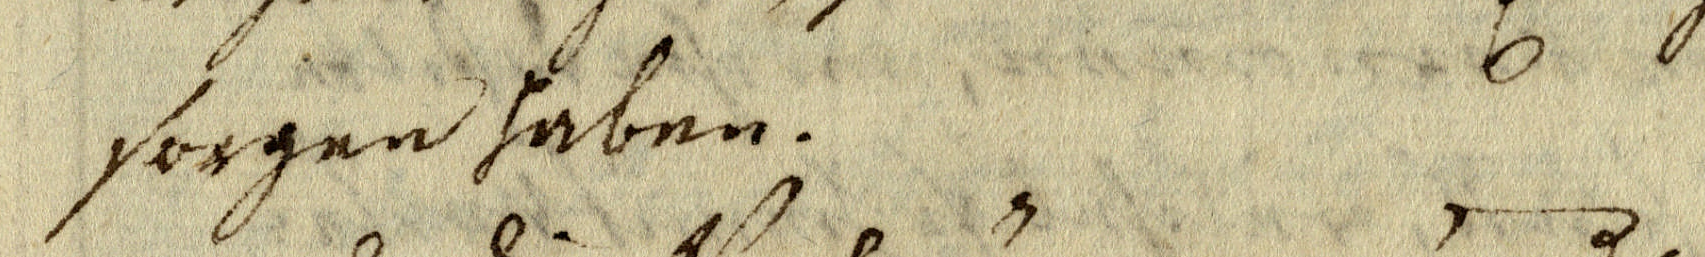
sorgen haben.
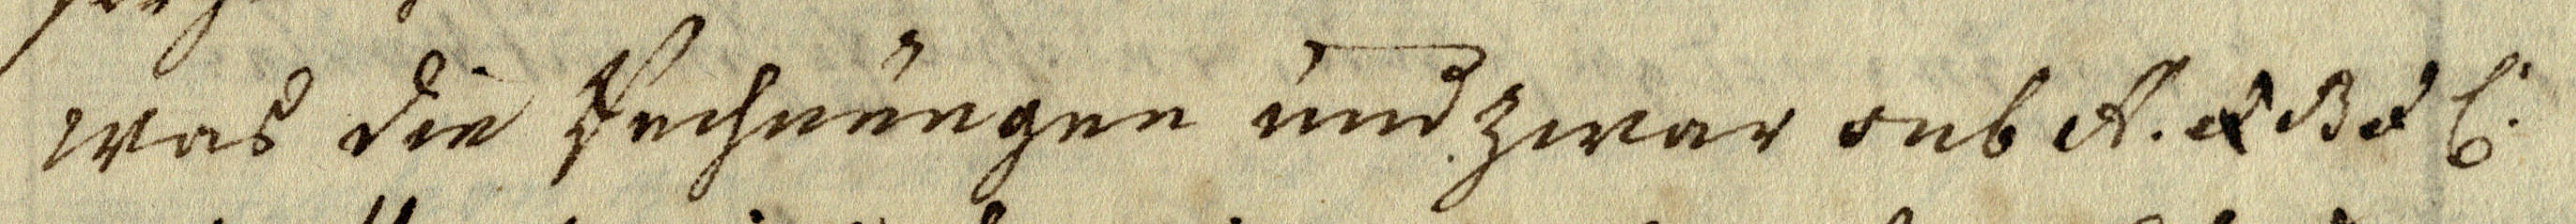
Was die Rechnungen und zwar sub A. et B. et C.
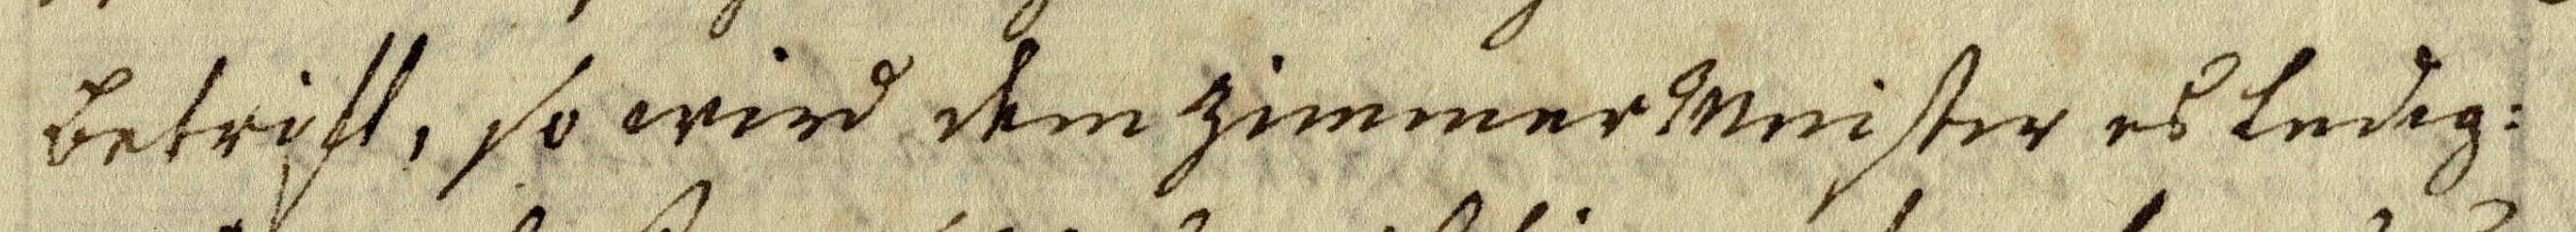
betrift, so wird dem ZimmerMeister es ledig¬
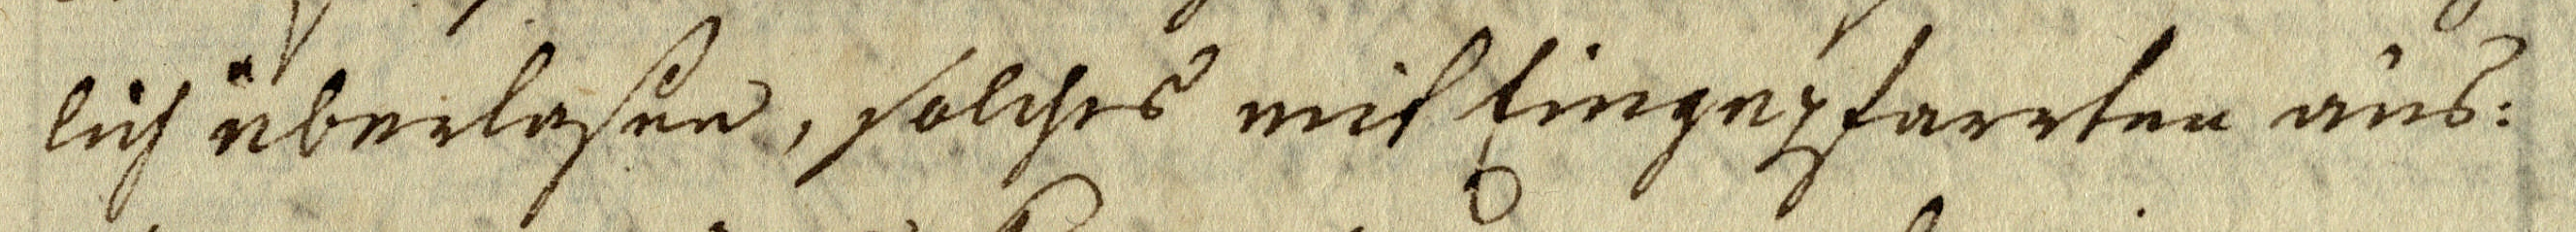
lich überlaßen, solches mit Eingepfarrten aus¬
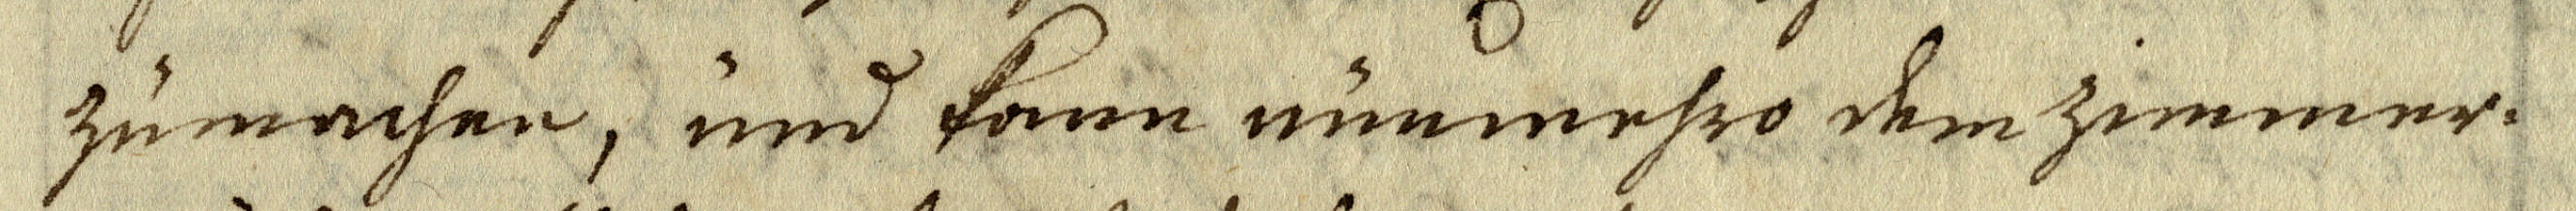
zumachen, und kann nunmehro dem Zimmer¬
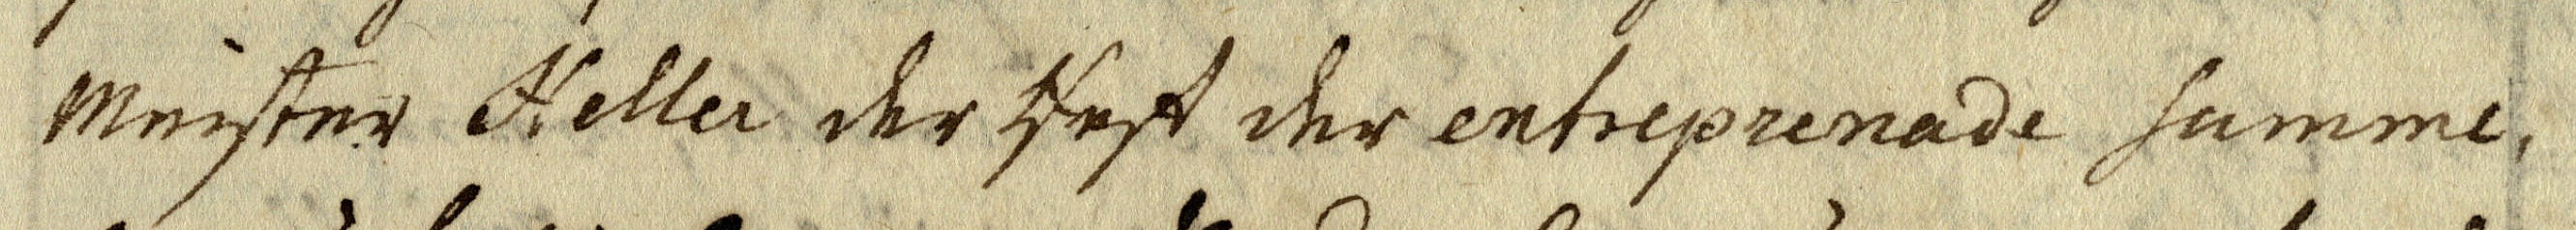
Meister Heller der Rest der entreprenade summe,
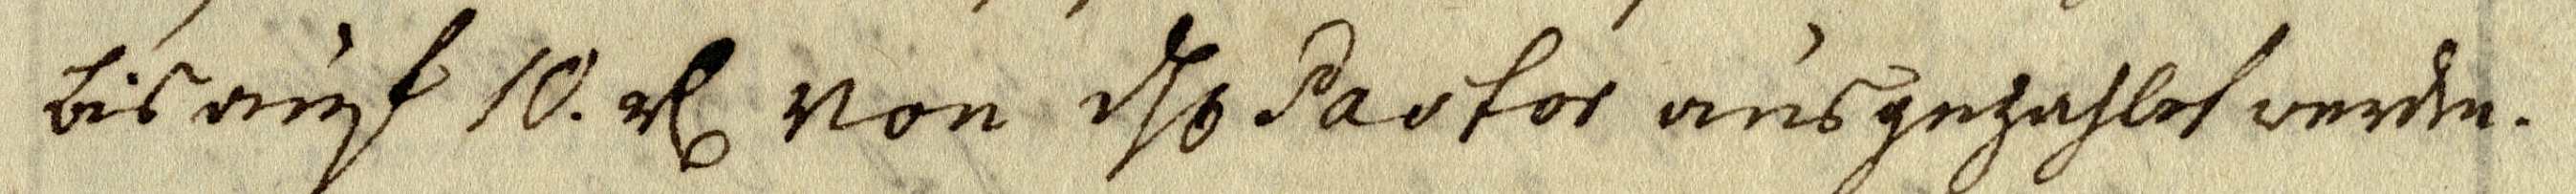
bis auf 10. rl. von dh Pastor ausgezahlet werden.
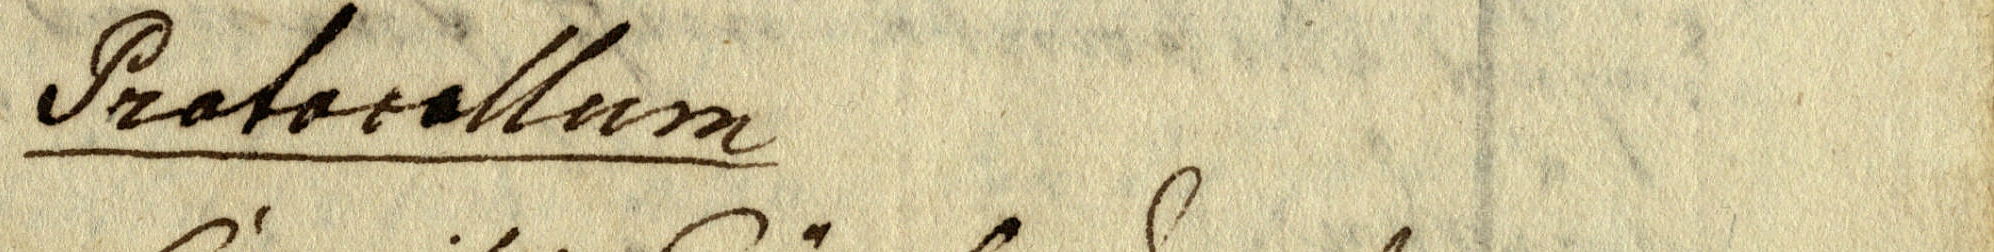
Protocollum
